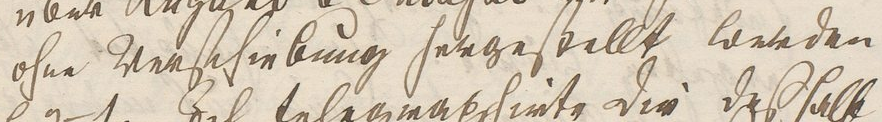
ohne Verschiebung hergestellt werden
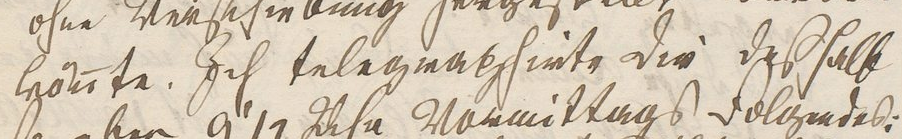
könnte. Ich telegraphirte Dir deßhalb
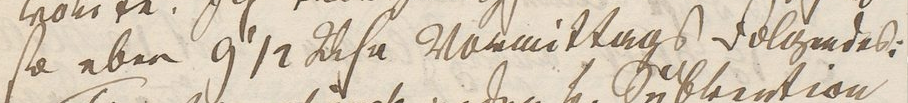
so eben 9½ Uhr Vormittags Folgendes:
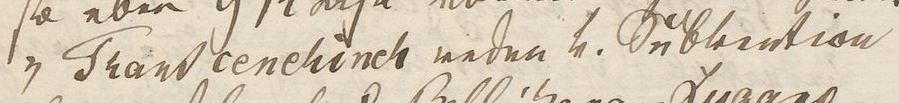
«Transceneriner reden v. Subvention
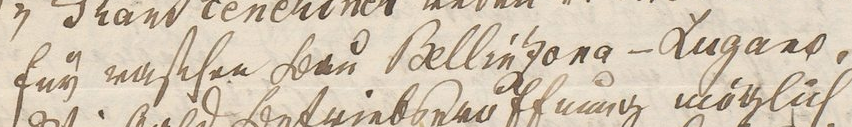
für raschen Bau Bellinzona – Lugano
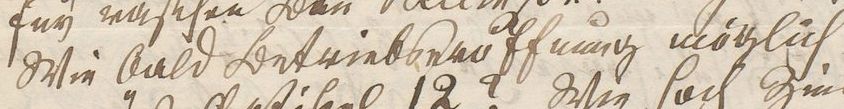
Wie bald Betriebseröffnung möglich
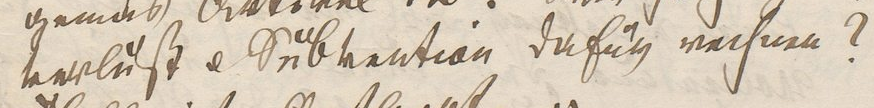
verlust & Subvention dafür rechnen?
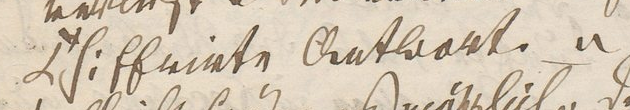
Chiffrirte Antwort.»
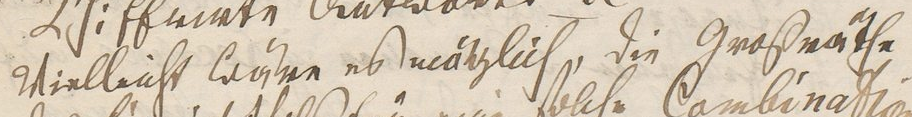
Vielleicht wäre es möglich, die Großräthe
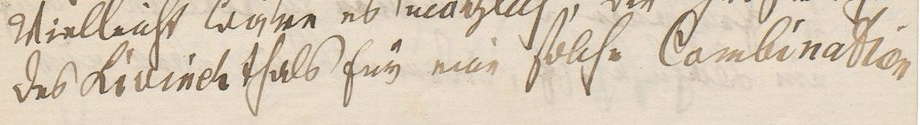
des Livinerthals für eine solche Combination
